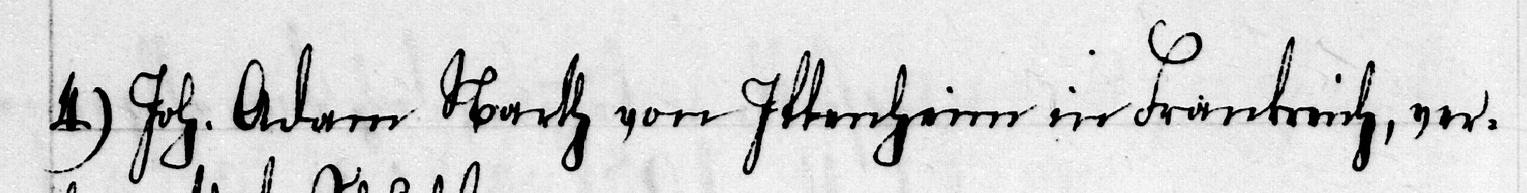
4.) Joh. Adam Narth von Illenheim in Frankreich, ver¬
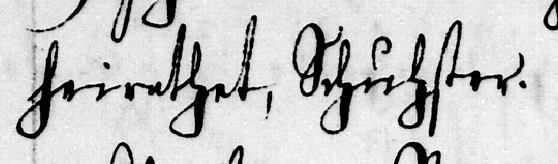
heirathet, Schuhster.
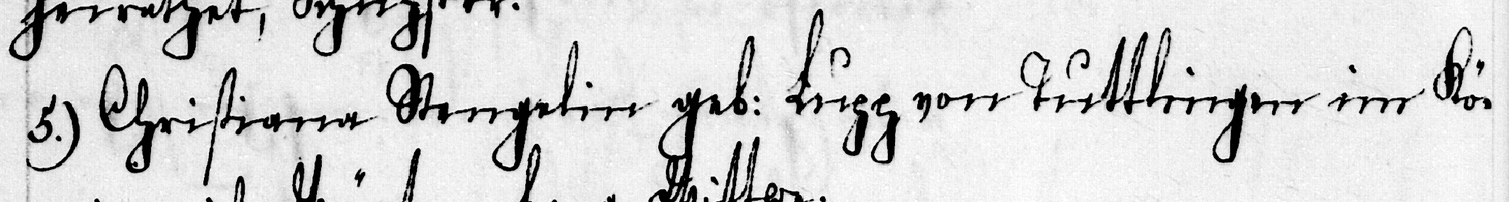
5.) Christiana Stengelin geb: Lupp von Tuttlingen im Kö¬
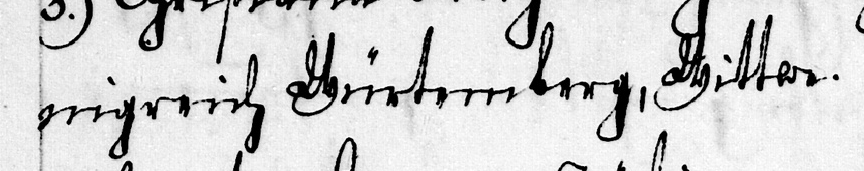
nigreich Würtemberg, Wittwe.
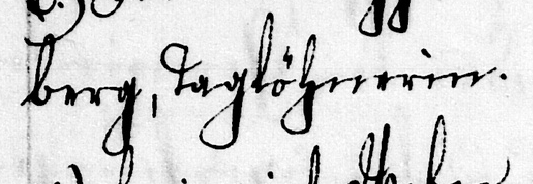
berg, Taglöhnerin.
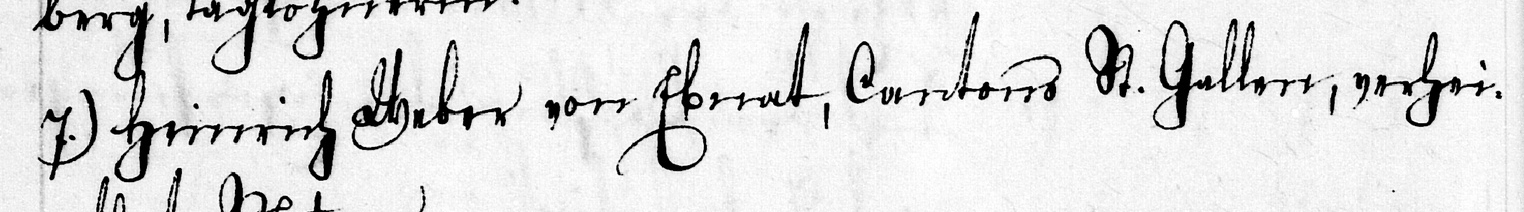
7.) Heinrich Weber von Ebnat, Cantons St. Gallen, verhei¬
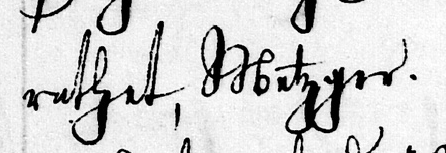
rathet, Metzger.
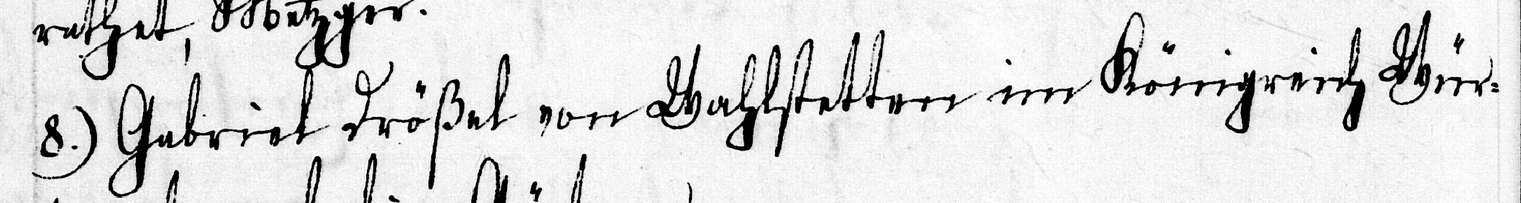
8.) Gabriel Drößel von Wahlstetten im Königreich Wür¬
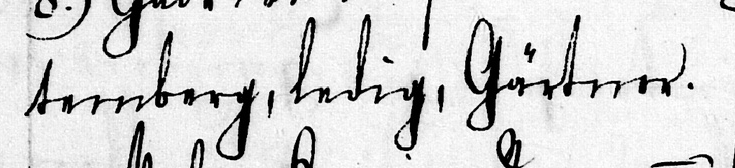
temberg, ledig, Gärtner.
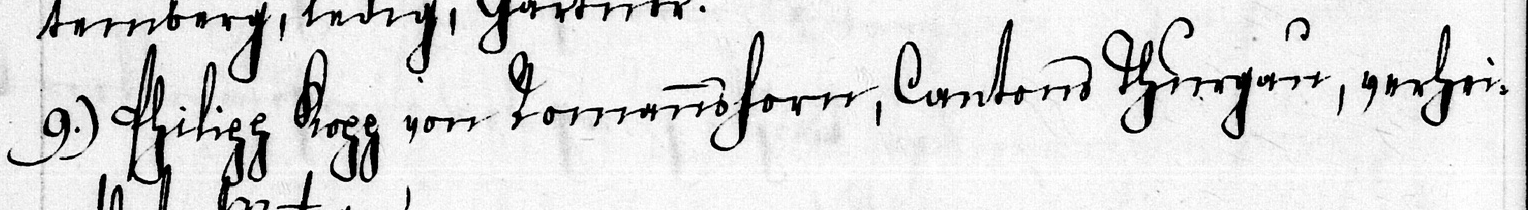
9.) Philipp Kopp von Romanshorn, Cantons Thurgau, verhei¬
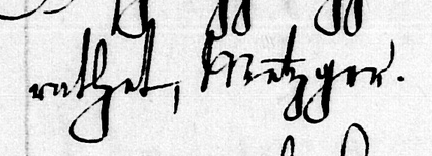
rathet, Metzger.
